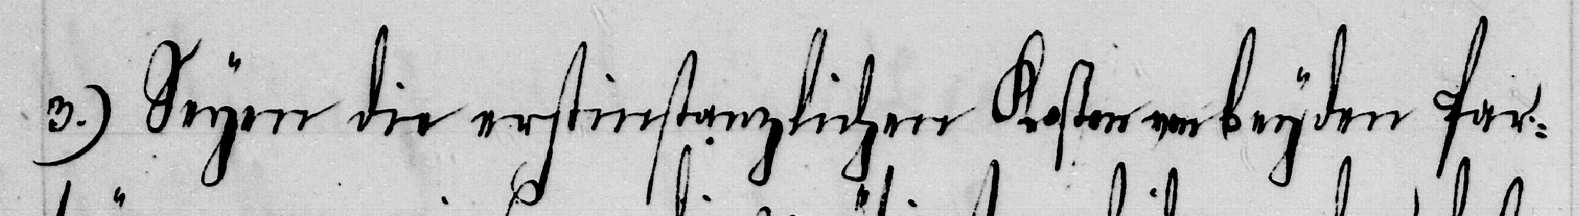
3.) Seyen die erstinstanzlichen Kosten von beyden Par¬
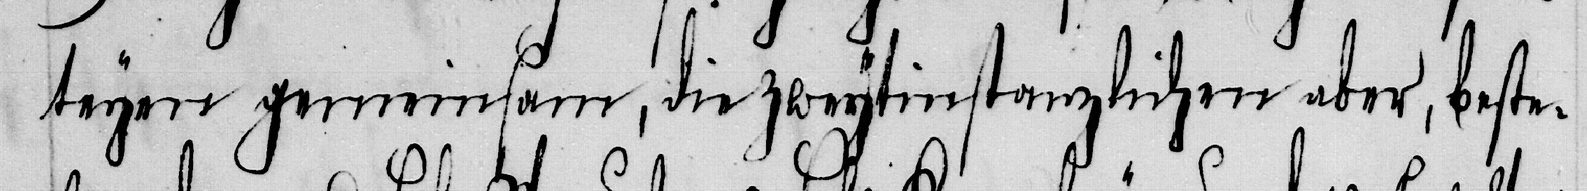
teyen gemeinsam, die zweytinstanzlichen aber, beste¬
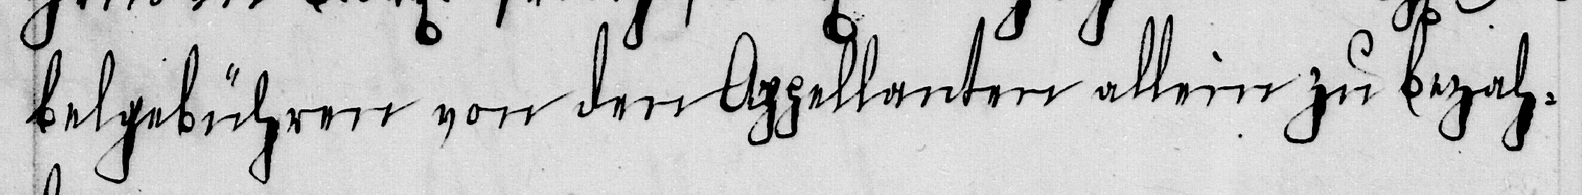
belgebühren von den Appellanten allein zu bezah¬
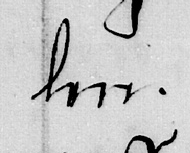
len.
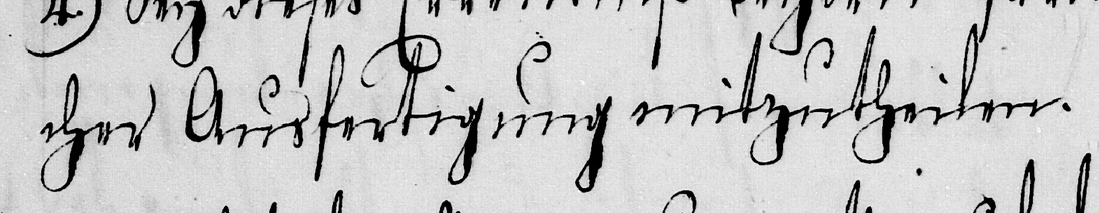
cher Ausfertigung mitzutheilen.
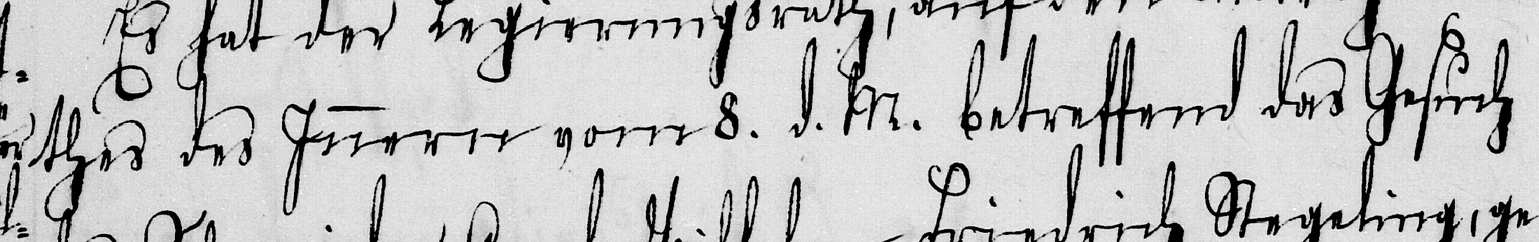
thes des Innern vom 8. d. M. betreffend das Gesuch
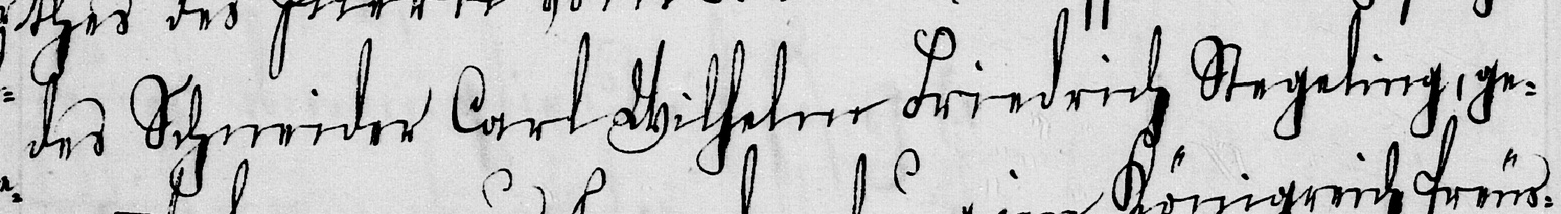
des Schneider Carl Wilhelm Friedrich Stegeling, ge¬
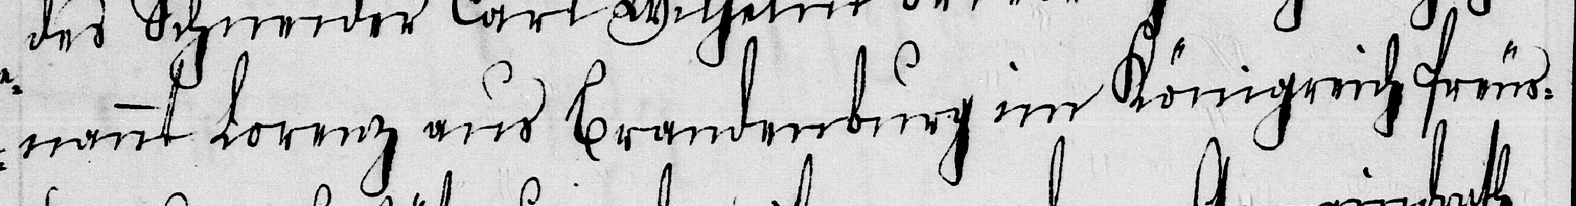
nannt Lorenz aus Brandenburg im Königreich Preuß¬
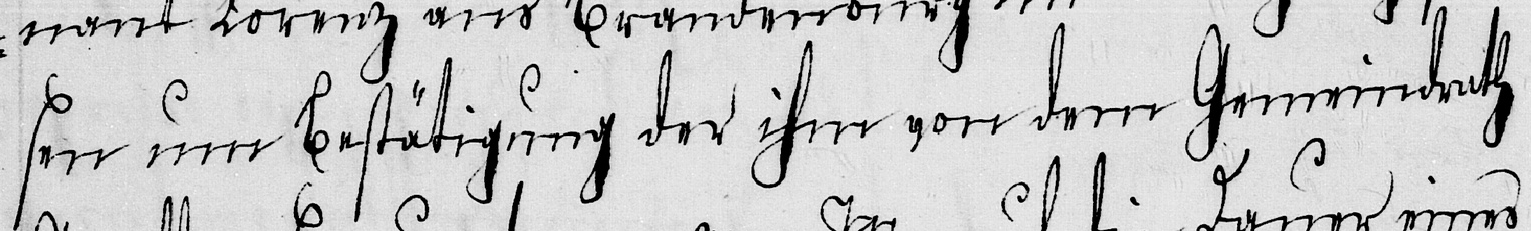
en um Bestätigung der ihm von dem Gemeindrath
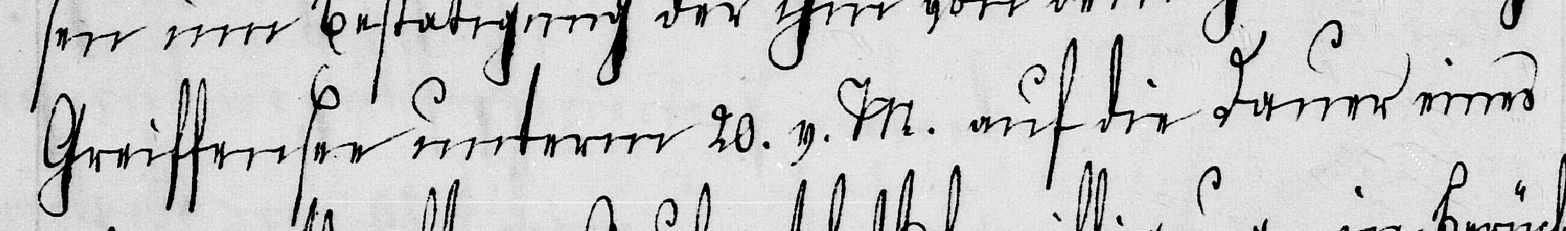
Greiffensee unterm 20. v. M. auf die Dauer eines
